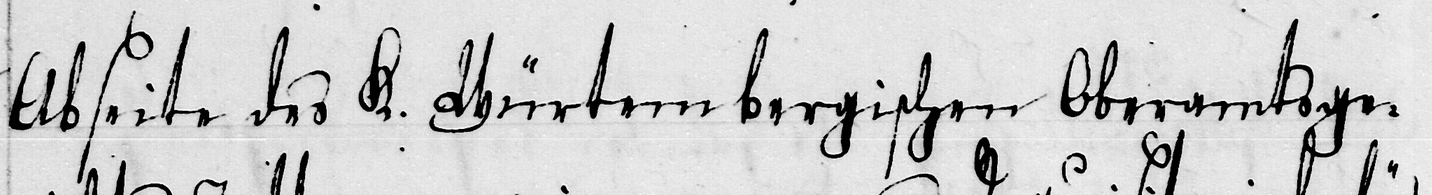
Abseite des K. Würtembergischen Oberamtsge¬
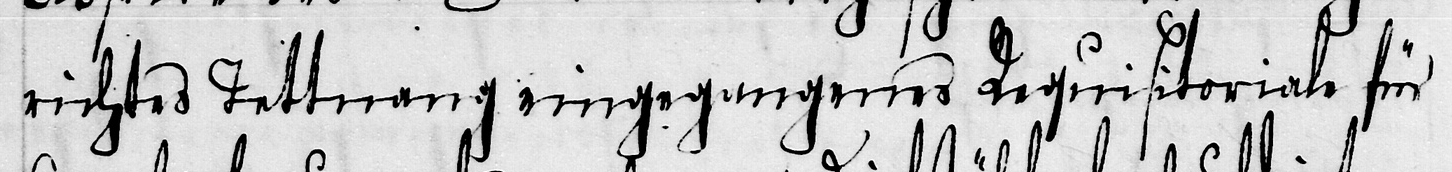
richtes Tettnang eingegangenes Requisitoriale für
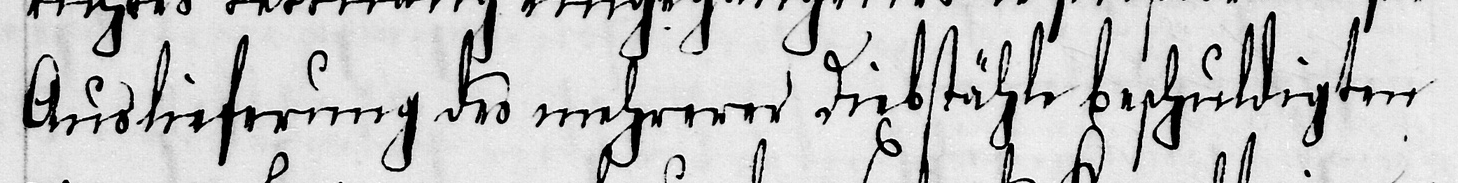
Auslieferung des mehrerer Diebstähle beschuldigten
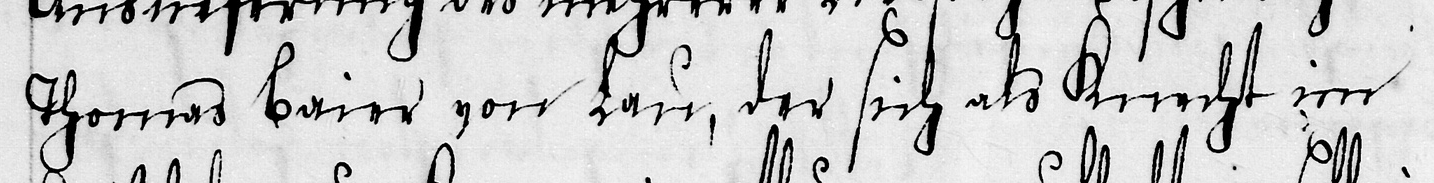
Thomas Baier von Lau, der sich als Knecht im
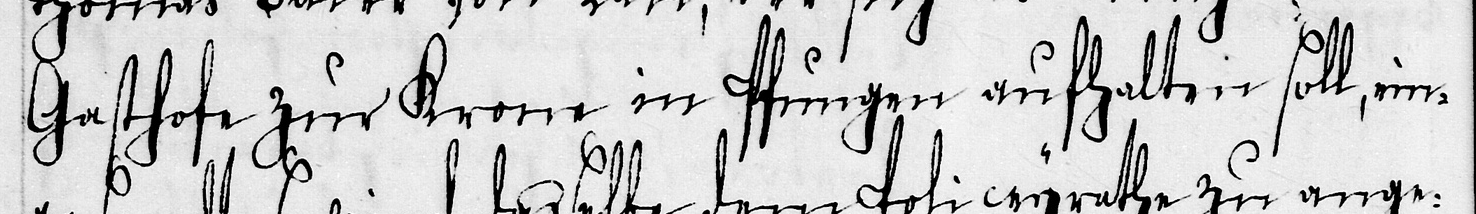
Gasthofe zur Krone im Pfungen aufhalten soll, e¬
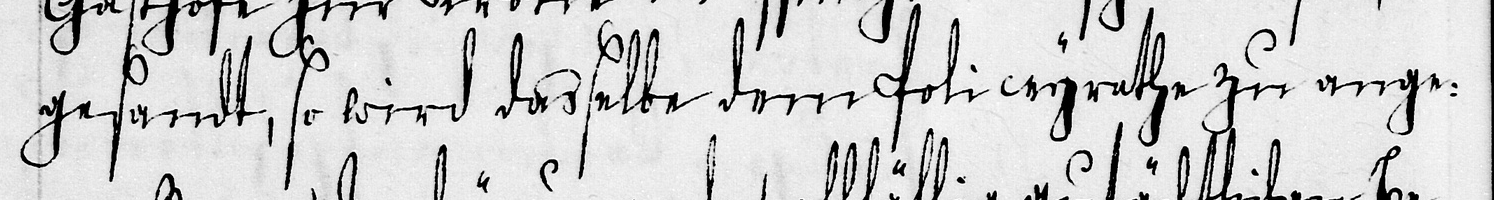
gesandt, so wird dasselbe dem Policeyrathe zu ange¬
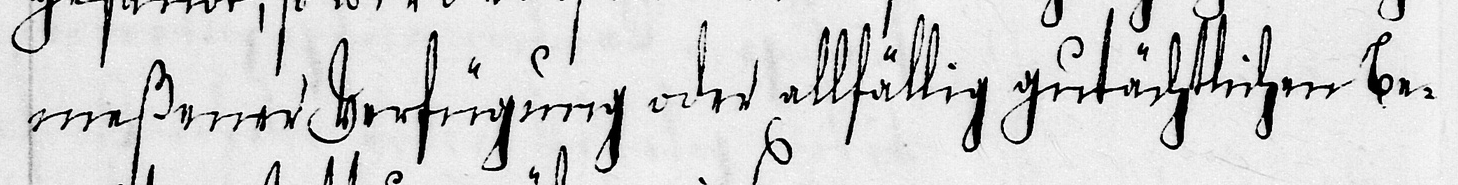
meßener Verfügung oder allfällig gutächtlichen Be¬
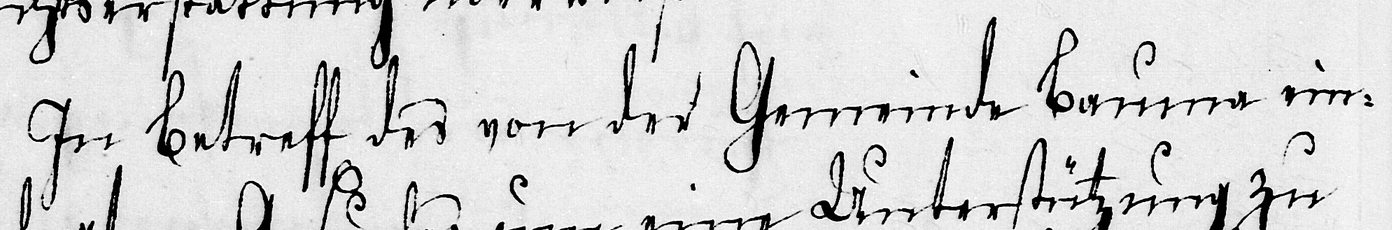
In Betreff des von der Gemeinde Bauma ein¬
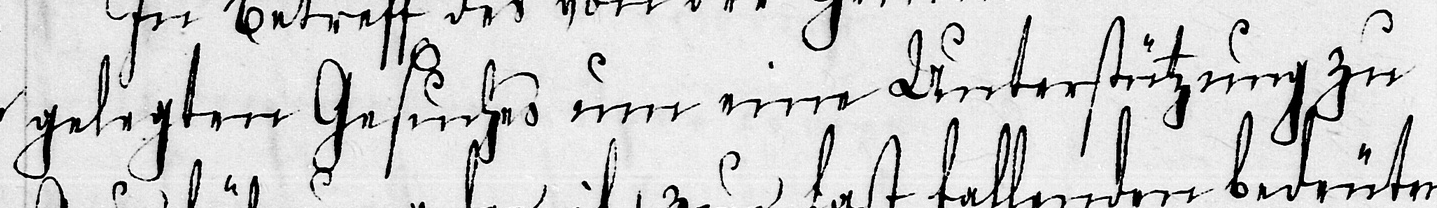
gelegten Gesuches um eine Unterstützung zu
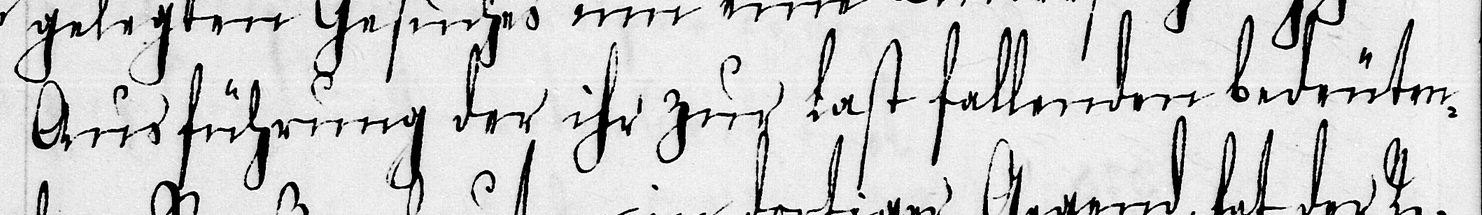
Ausführung der ihr zur Last fallenden bedeuten¬
